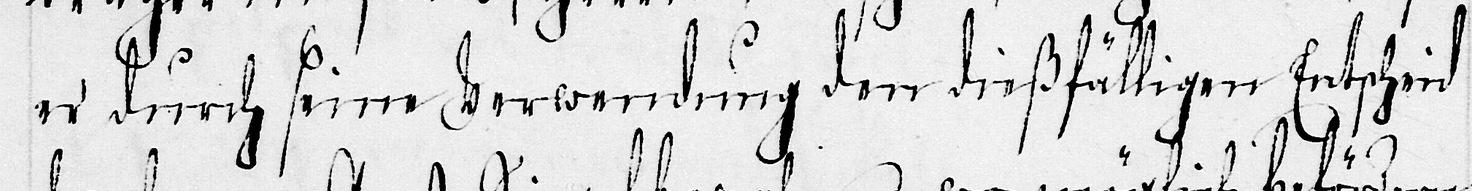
er durch seine Verwendung den dießfälligen Entscheid
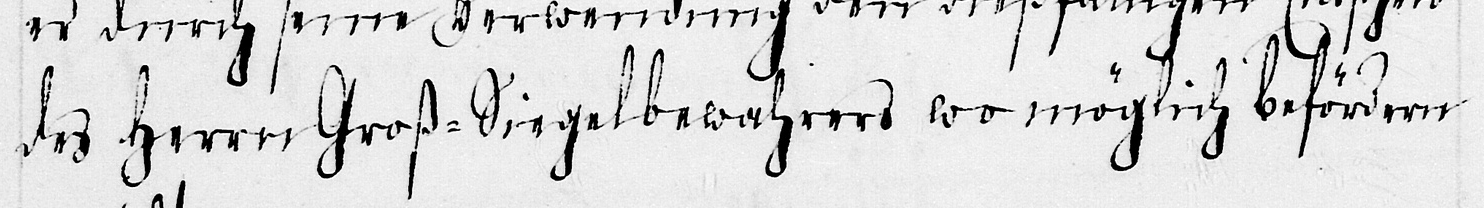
des Herrn Groß-Siegelbewahrers wo möglich befördern
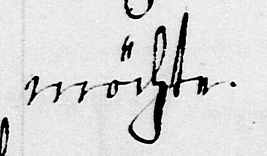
möchte.
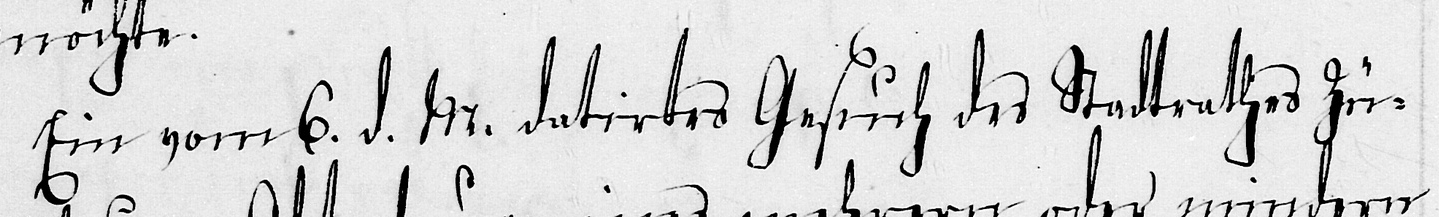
Ein vom 6. d. M. datirtes Gesuch des Stadtrathes Zü¬
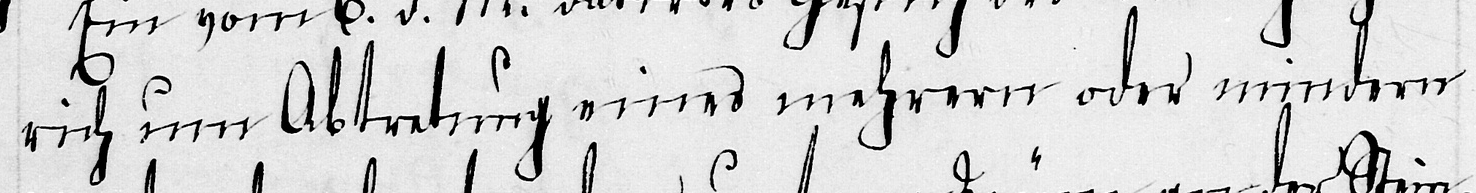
rich um Abtretung eines mehrern oder mindern
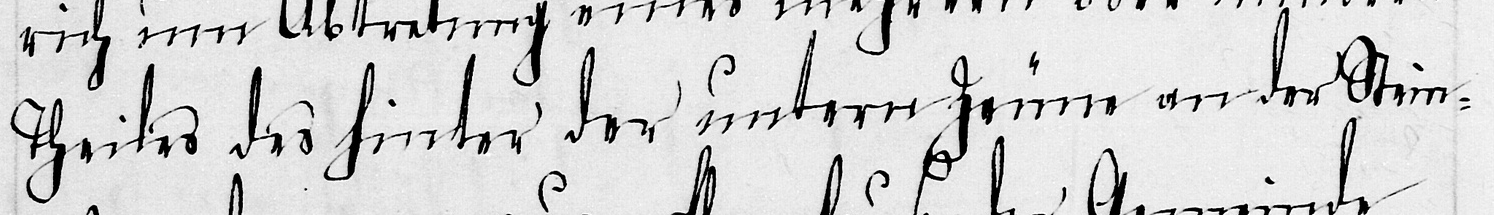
Theiles des hinter der untern Zeune an der Stein¬
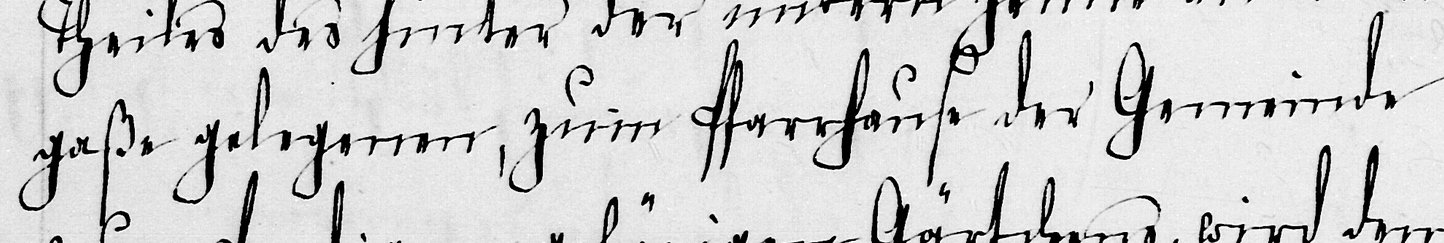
gaße gelegenen, zum Pfarrhause der Gemeinde
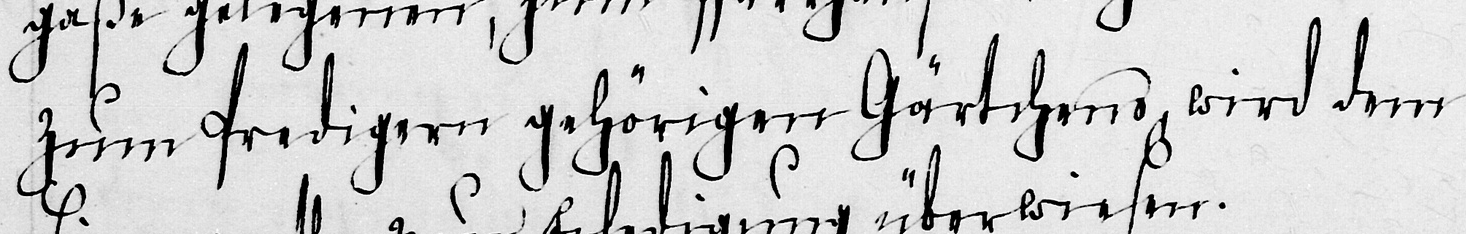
zum Predigern gehörigen Gärtchens, wird dem
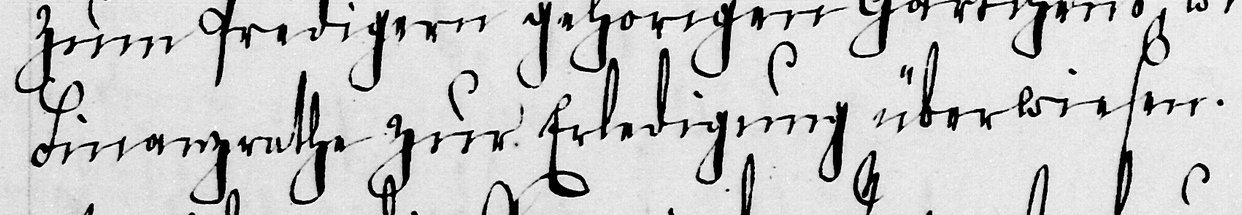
Finanzrathe zur Erledigung überwiesen.
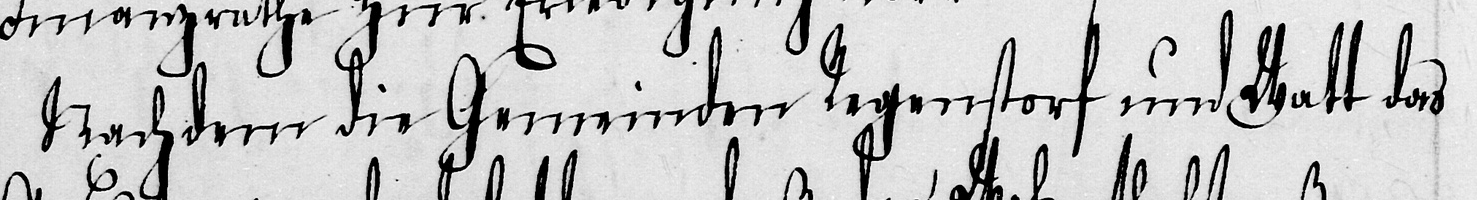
Nachdem die Gemeinden Regenstorf und Watt das
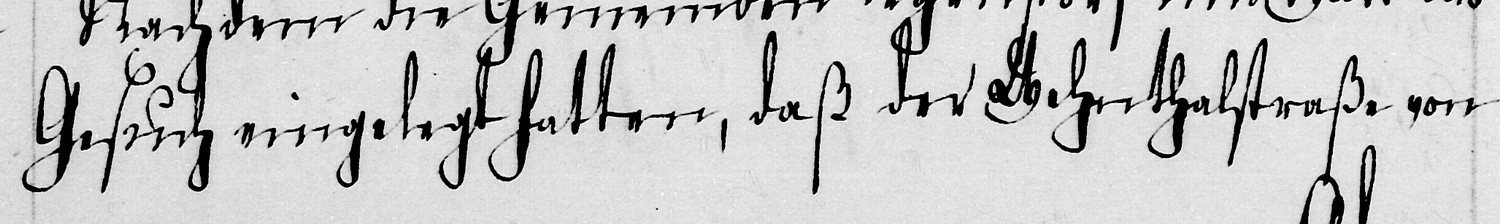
Gesuch eingelegt hatten, daß der Wehnthalstraße von
